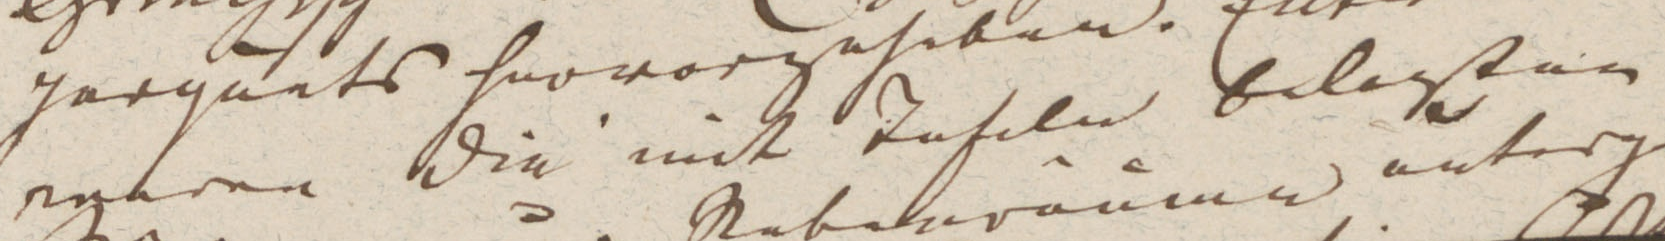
waren die mit Tafeln belegten
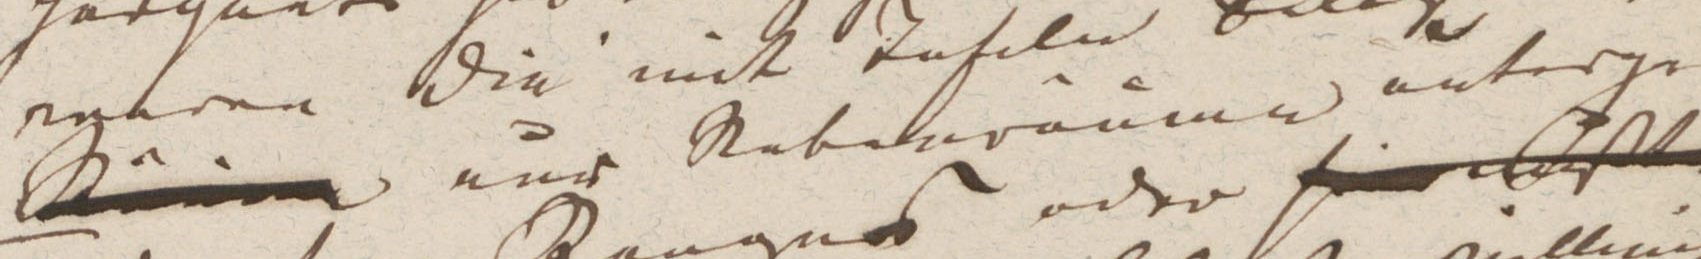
Räume nur Nebenräume unterge-
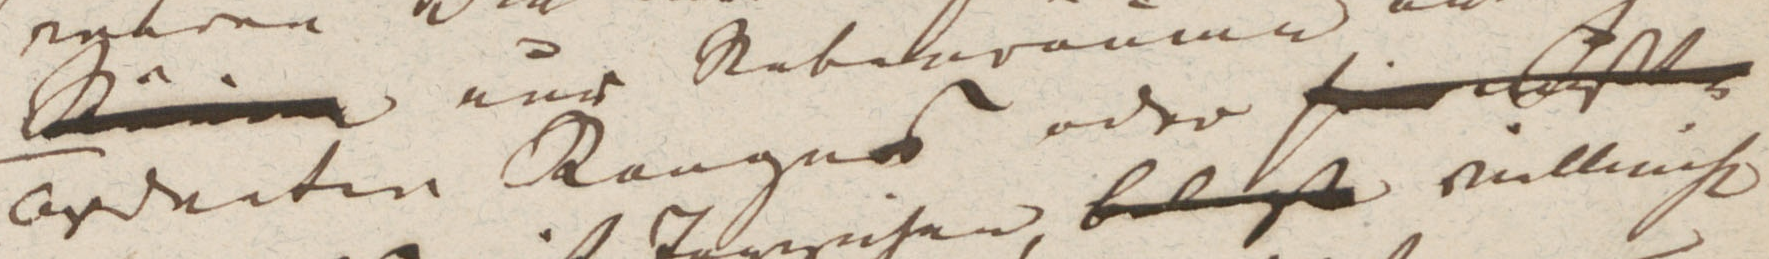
ordneten Ranges oder sie mussten
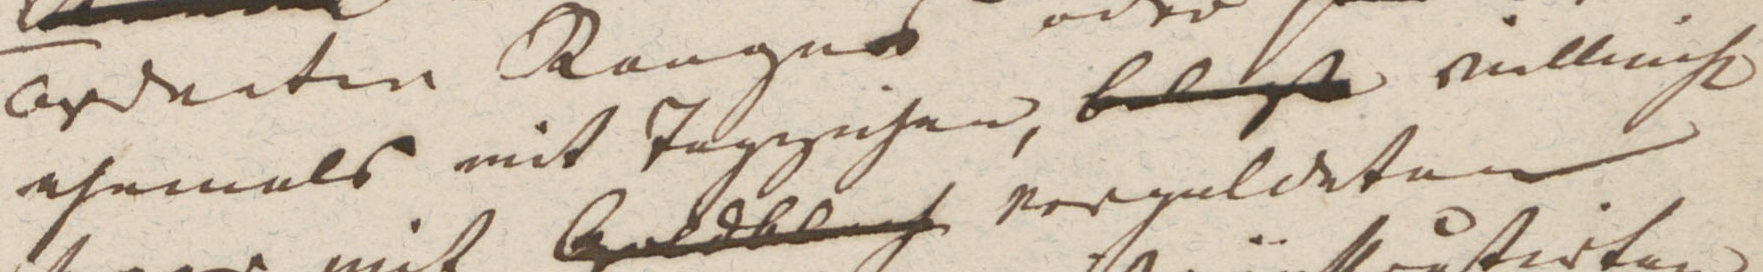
ehemals mit Teppichen, belegt vielleicht
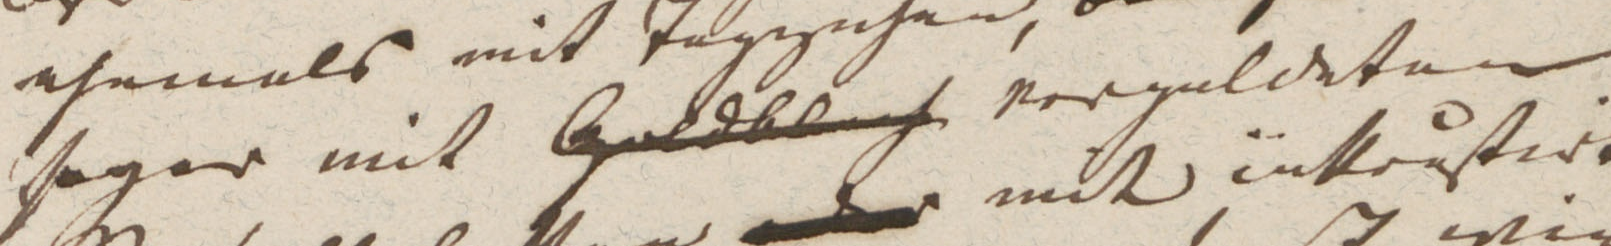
sogar mit Goldblech vergoldeten
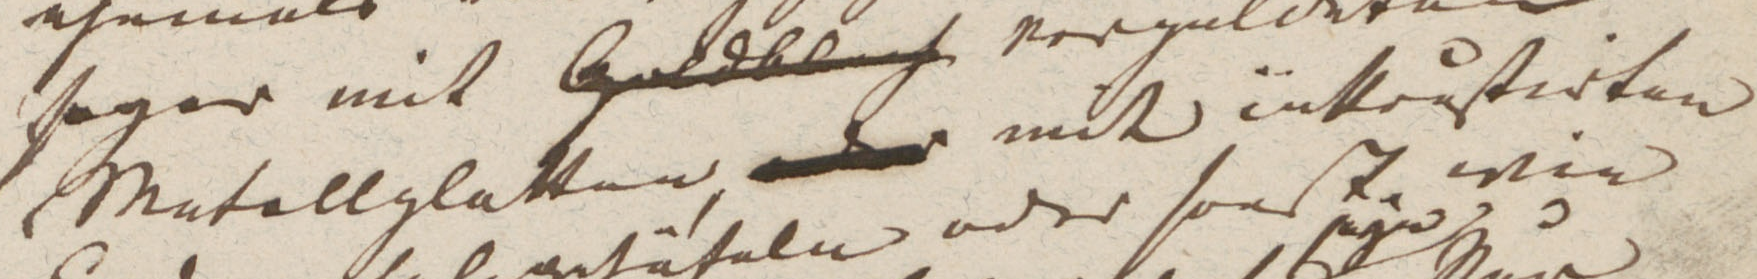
Metallplatten, oder mit inkrustirten
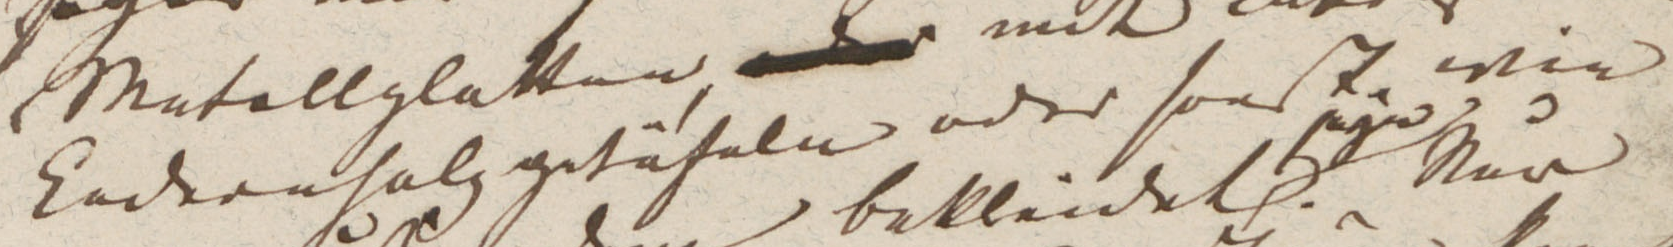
Cedernholzgetäfeln oder sonst wie
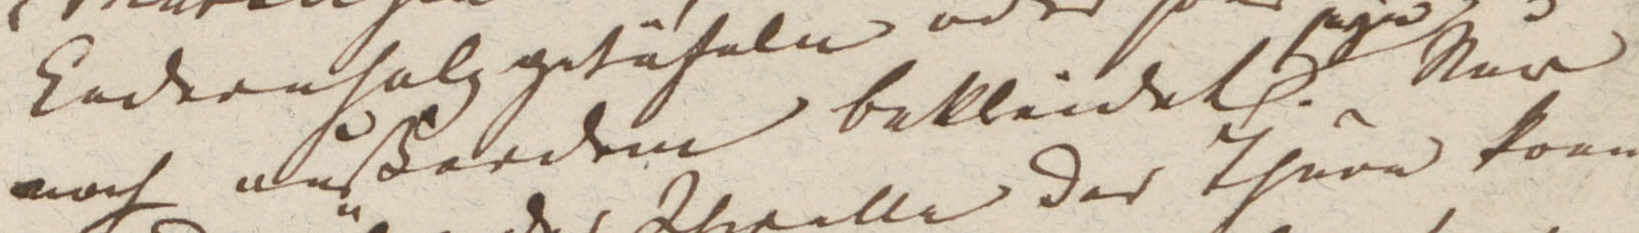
noch ausserdem bekleidet seyn. Nur
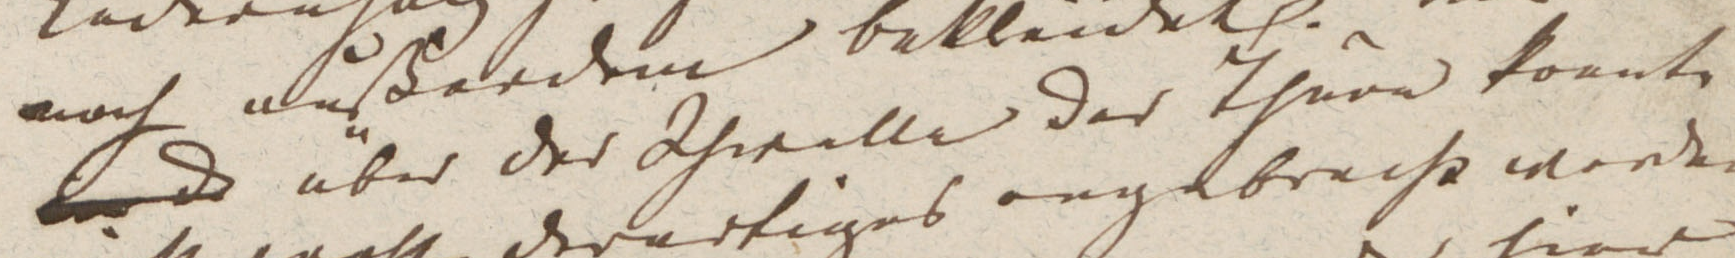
in d über der Schwelle der Thüre konnte
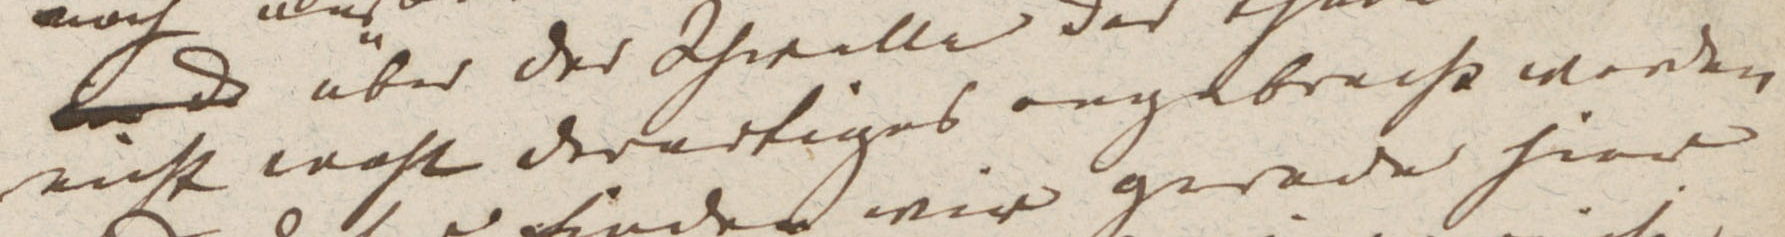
nicht wohl derartiges angebracht werden
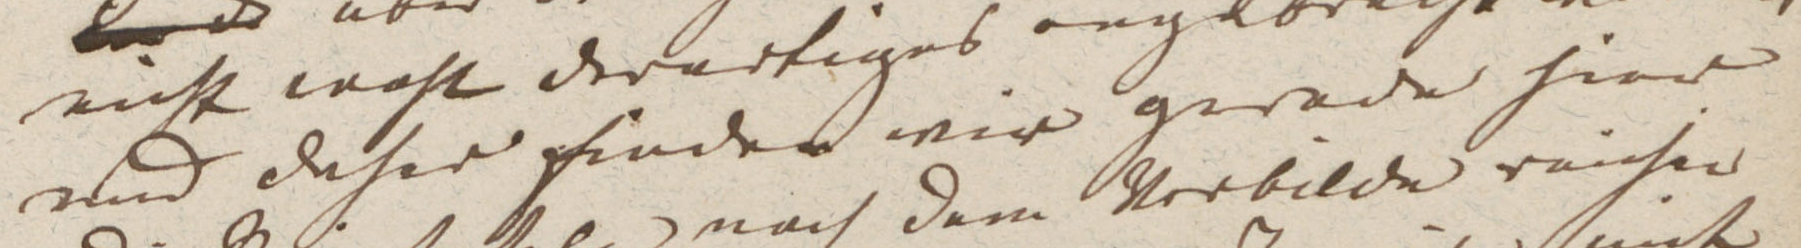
und daher finden wir gerade hier
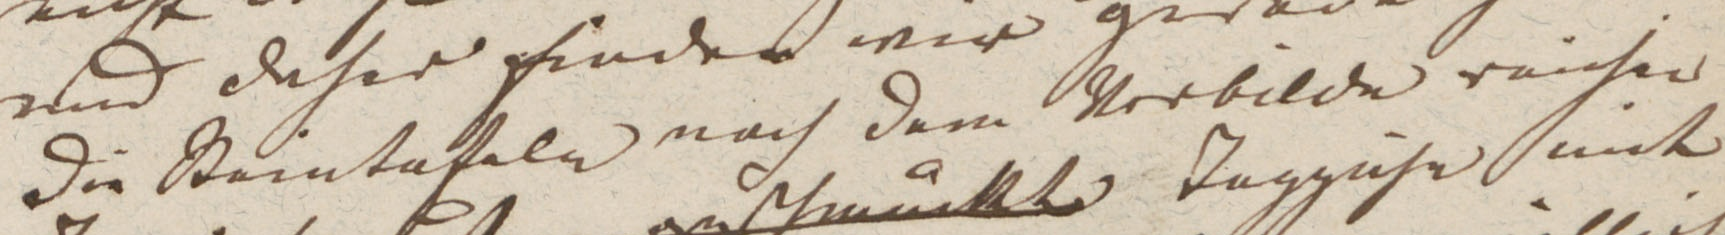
die Steintafeln nach dem Vorbilde reicher
